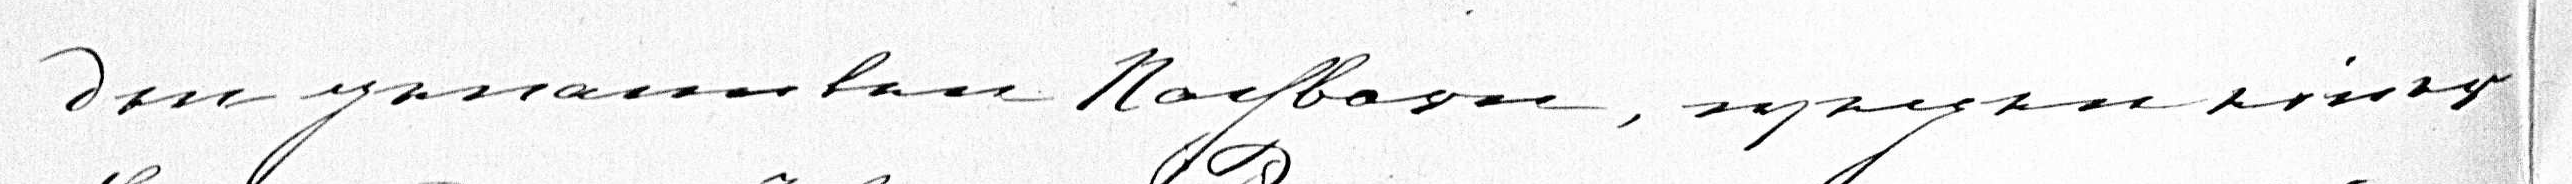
den genannten Nachbarn, wegen einer
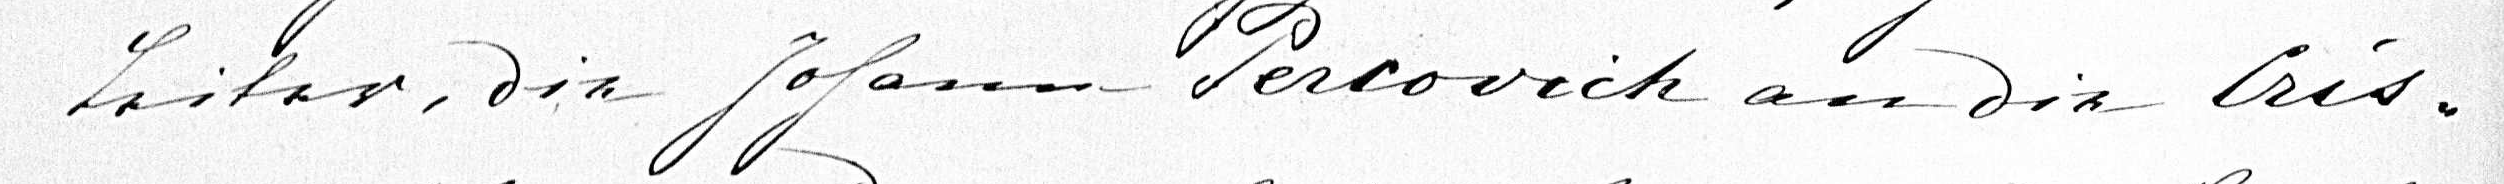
Leiter, die Johann Percovich an die Cris¬
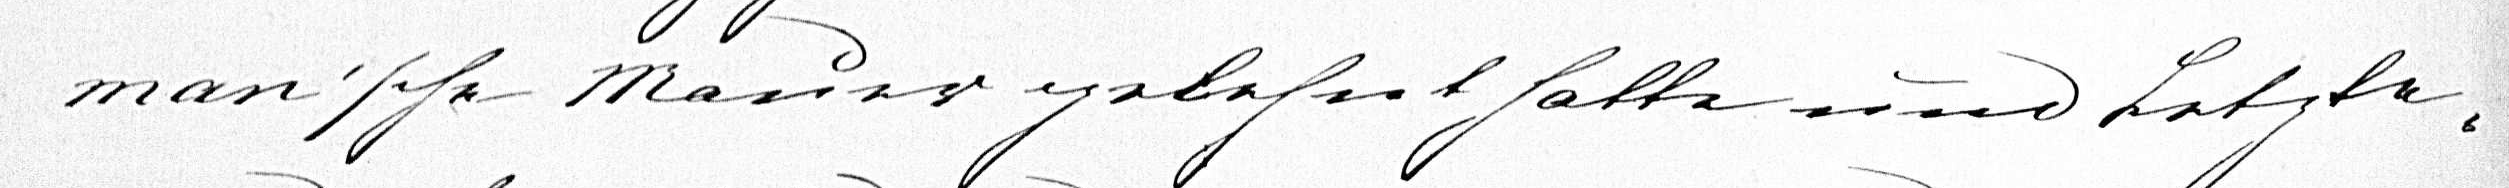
man'sche Mauer gelehnt hatte und Letzte¬
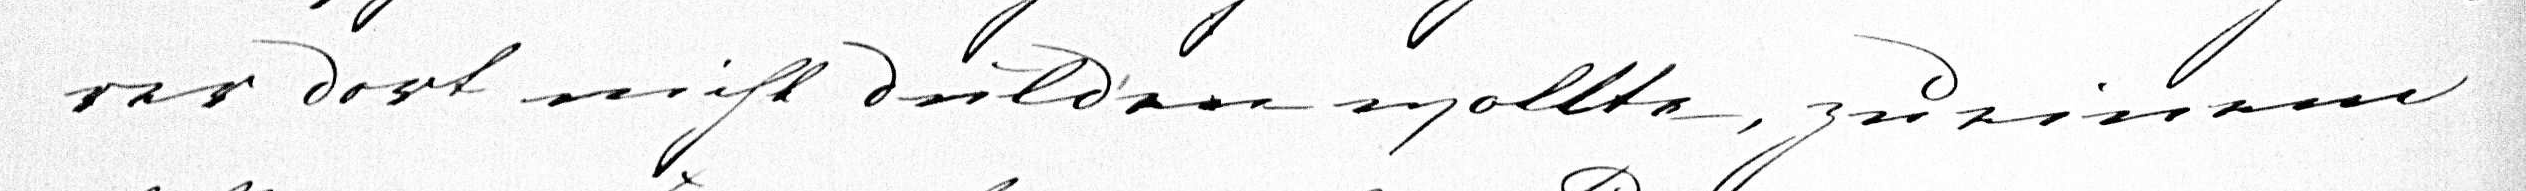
rer dort nicht dulden wollte, zu einem
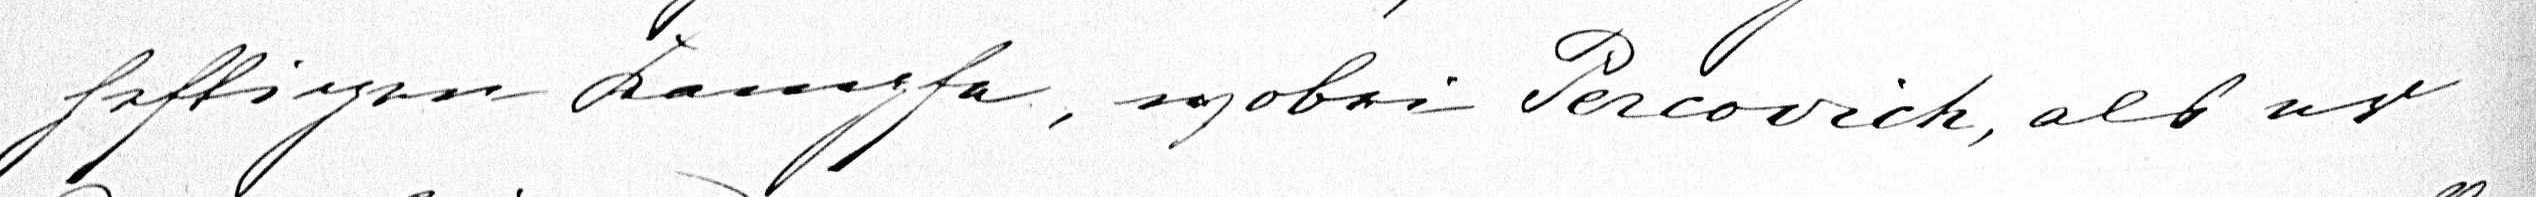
heftigen Kampfe, wobei Percovich, als er
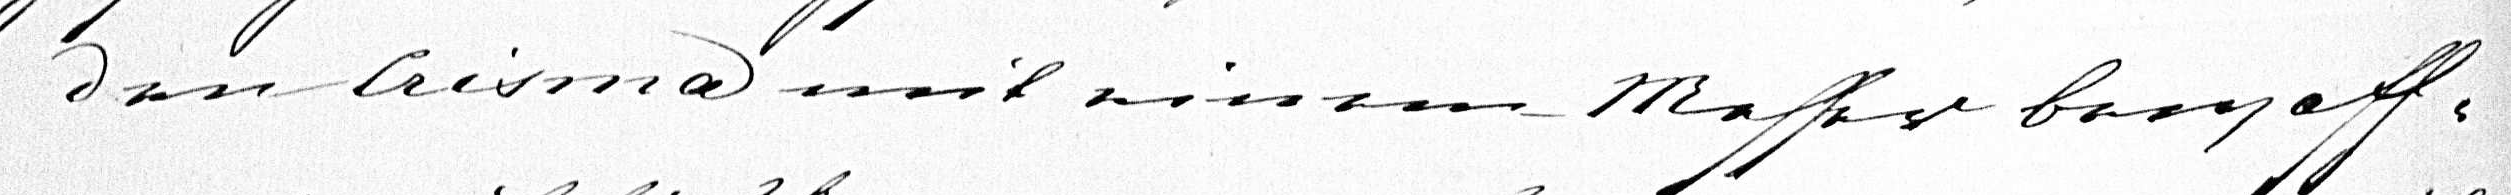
den Crisma mit einem Messer bewaff¬
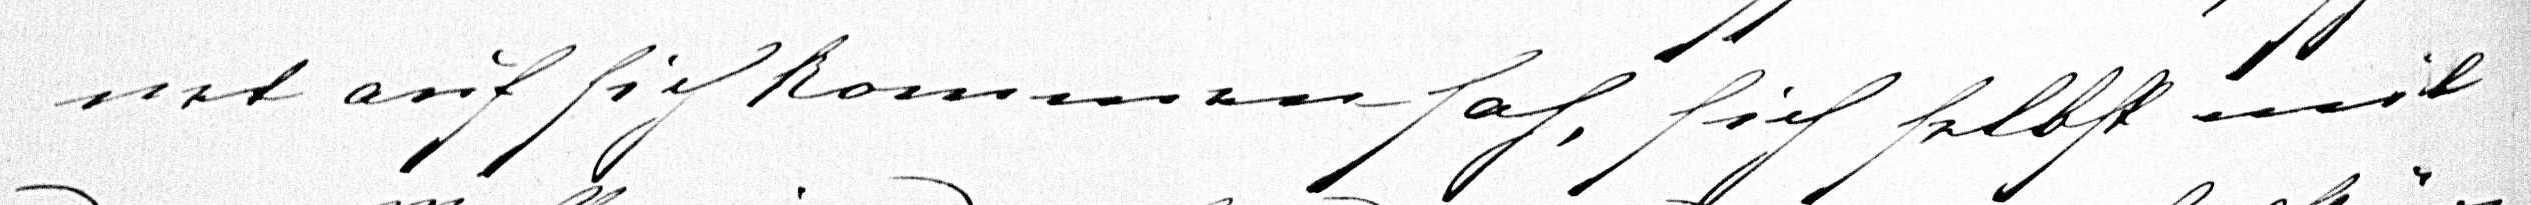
net auf sich kommen hah, sich selbst mit
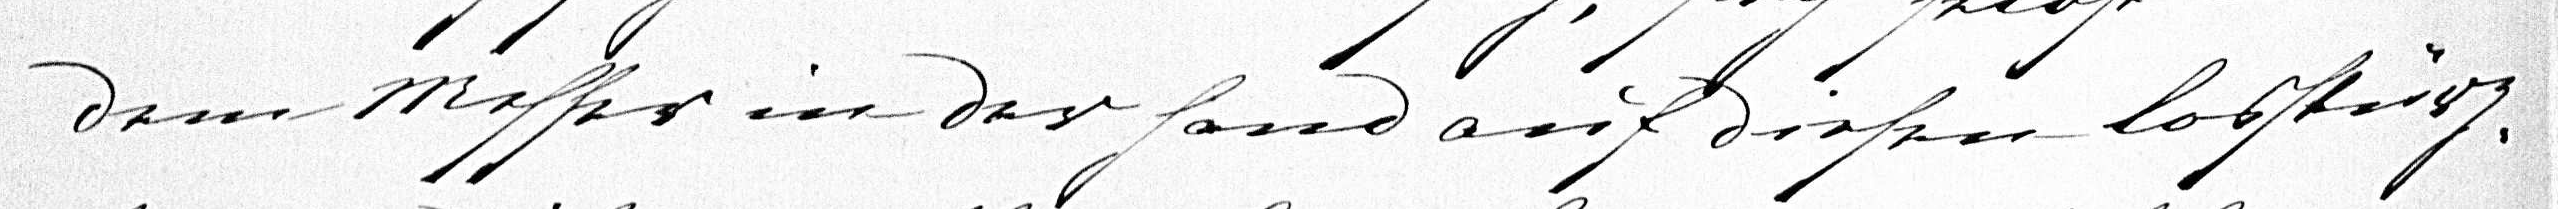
dem Messer in der hand auf diesen losstürz¬
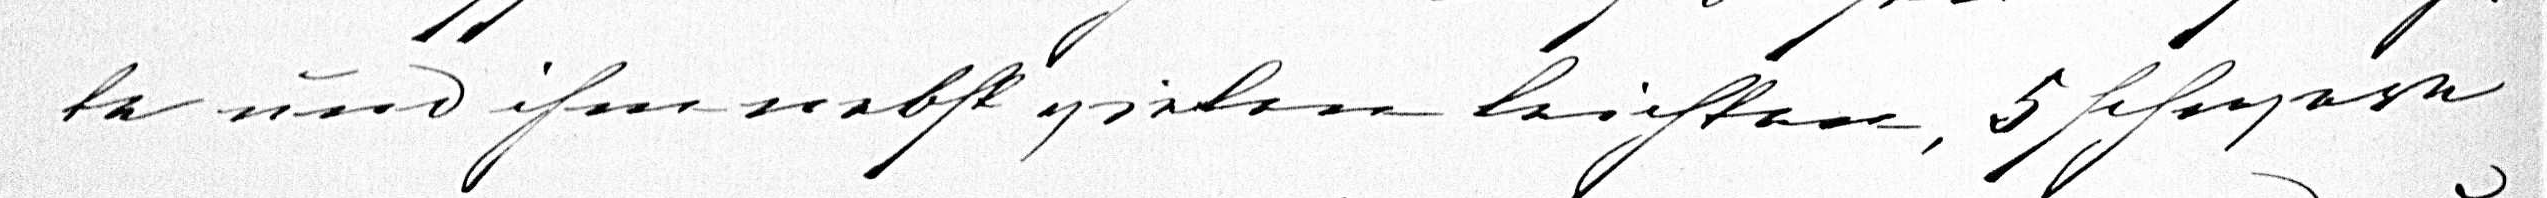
te und ihm nebst vielen leichten, 5 schwere
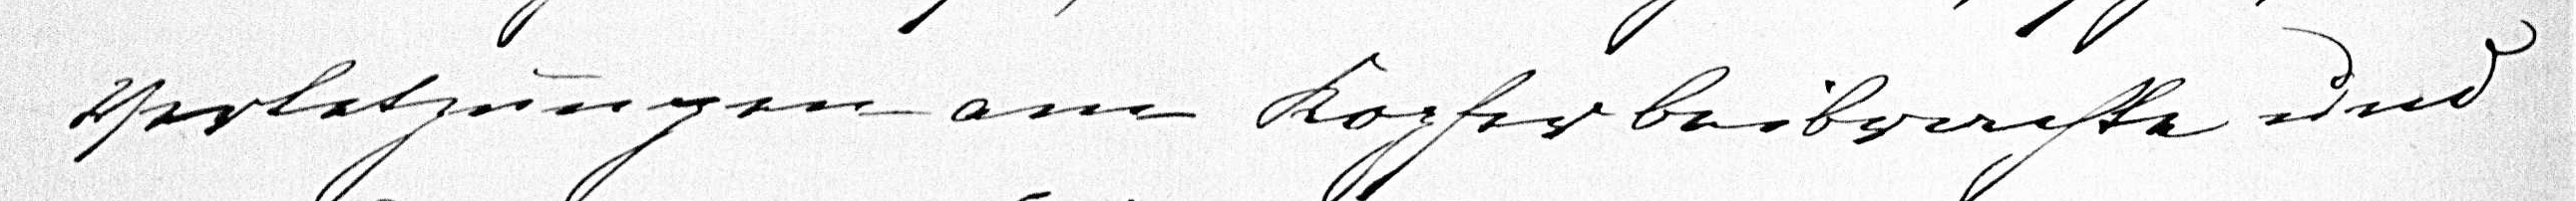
Verletzungen am Kopferbeibrachte und
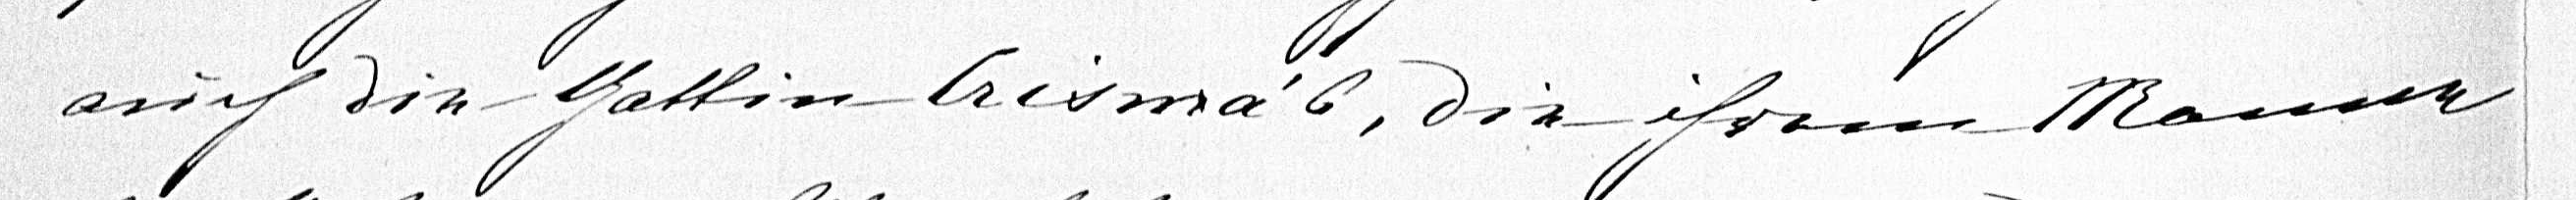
auch die Gattin Crisma's, die ihrem Manne
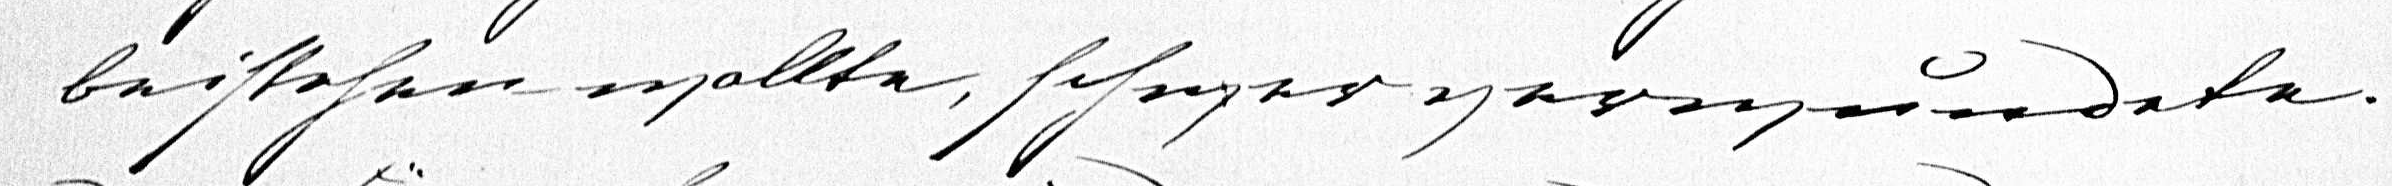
beistehen wollte, schwer verwundete.
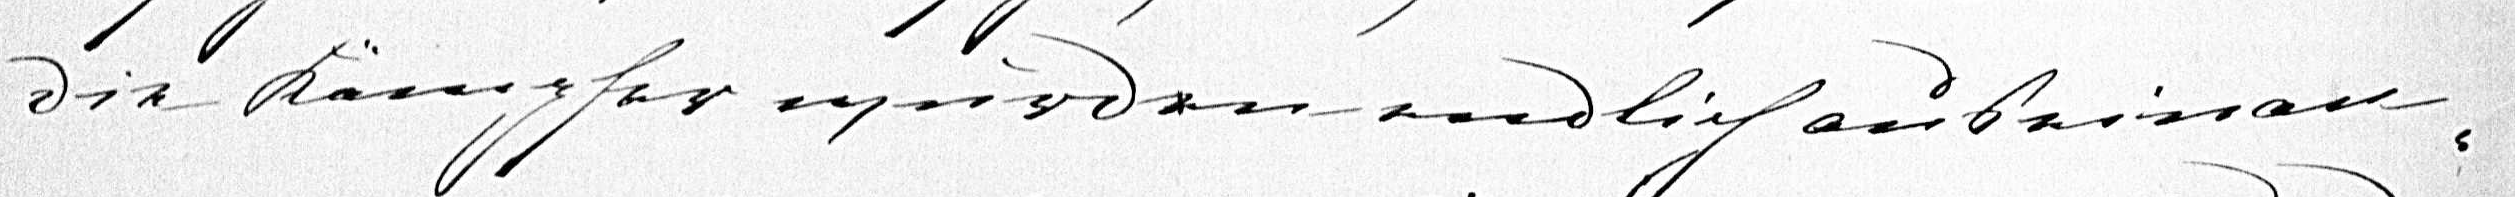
Die Kämpfer wurden endlich auseinan¬
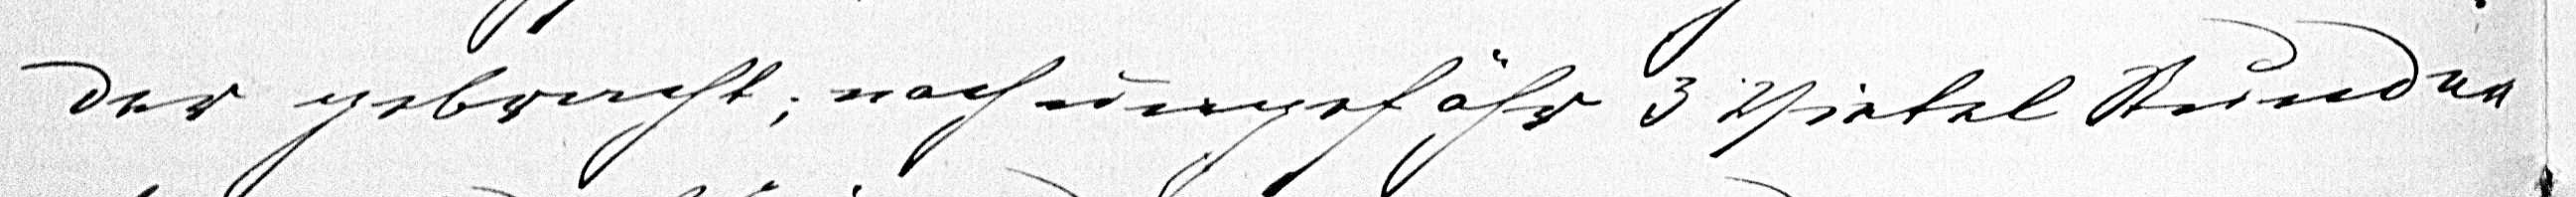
der gebracht; nach ungefähr 3 Viertel Stunden
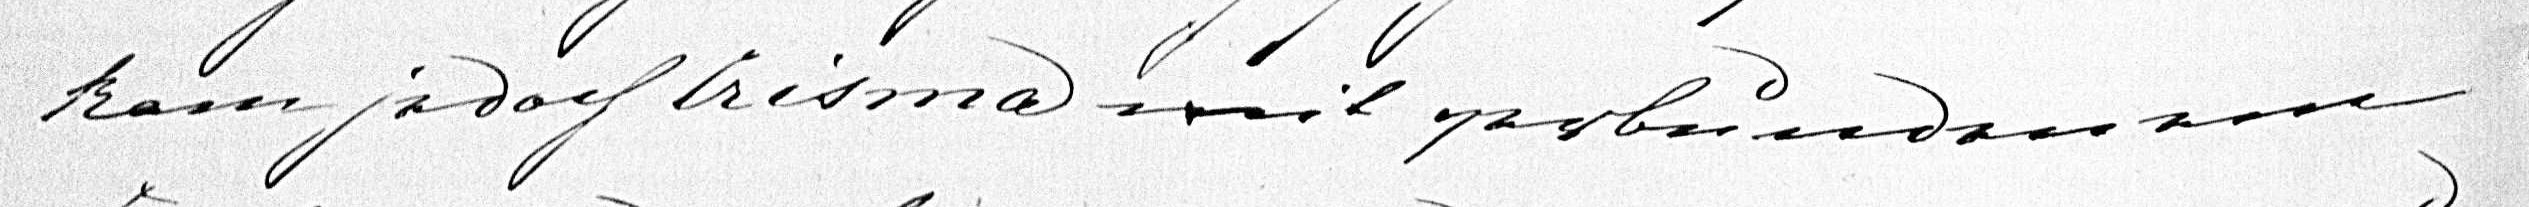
kam jedoch Crisma mit verbundenem
